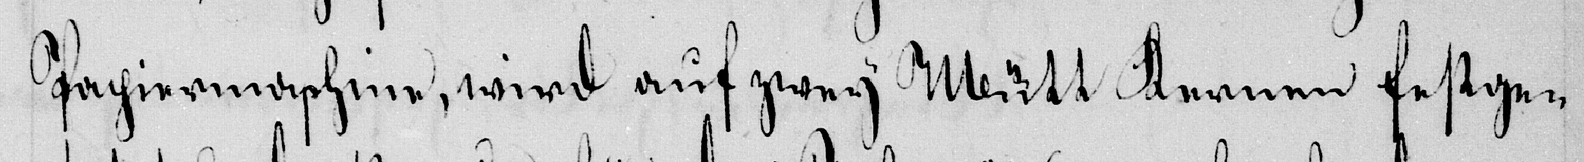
Papiermaschine, wird auf zwey Mütt Kernen festge¬
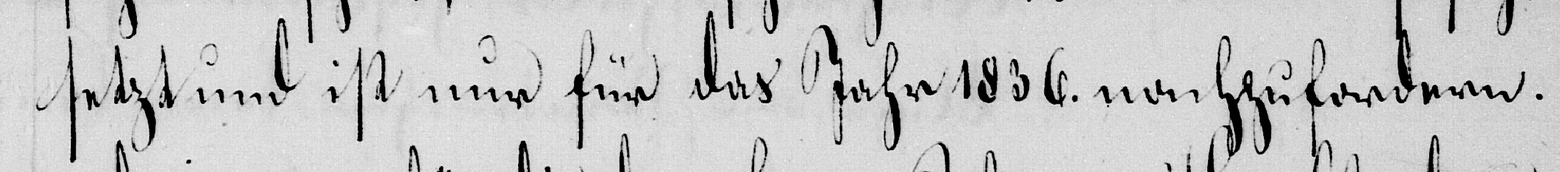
setzt und ist nur für das Jahr 1836. nachzufordern.
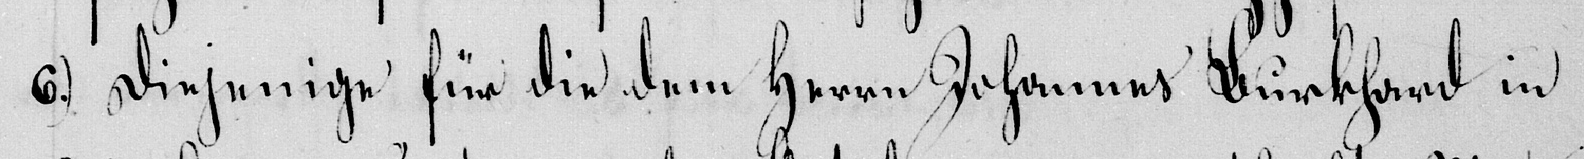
6.) Diejenige für die dem Herrn Johannes Burkhard in
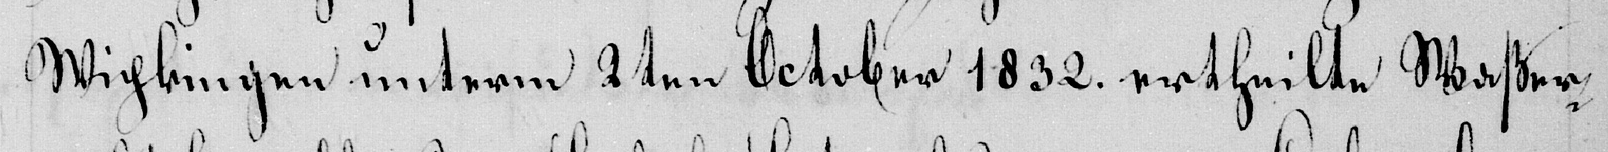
Wipkingen unterm 2ten October 1832. ertheilte Waßer¬
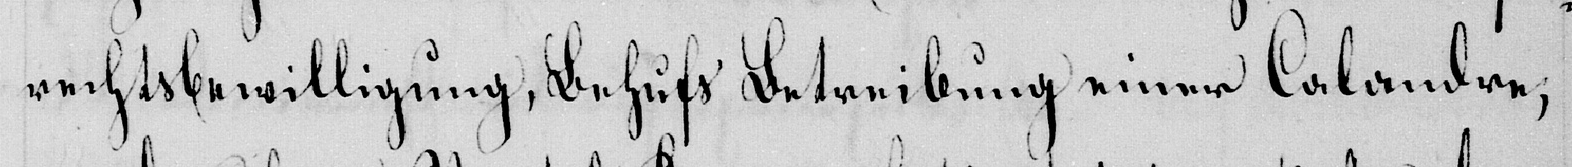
rechtsbewilligung, Behufs Betreibung einer Calandre,
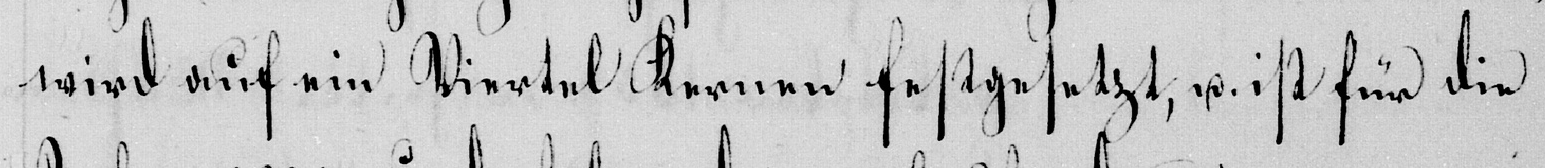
wird auf ein Viertel Kernen festgesetzt, u. ist für die
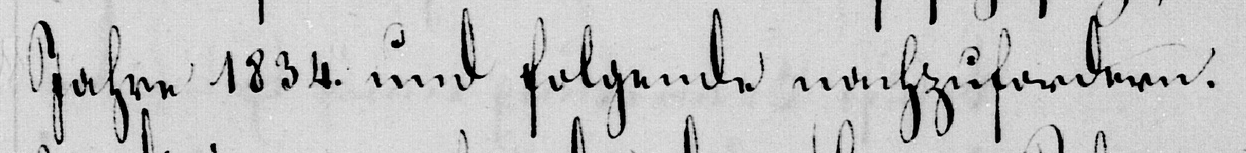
Jahre 1834. und folgende nachzufordern.
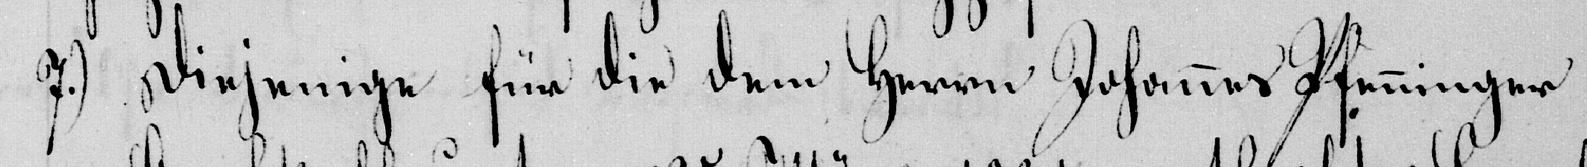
7.) Diejenige für die dem Herrn Johannes Pfenninger
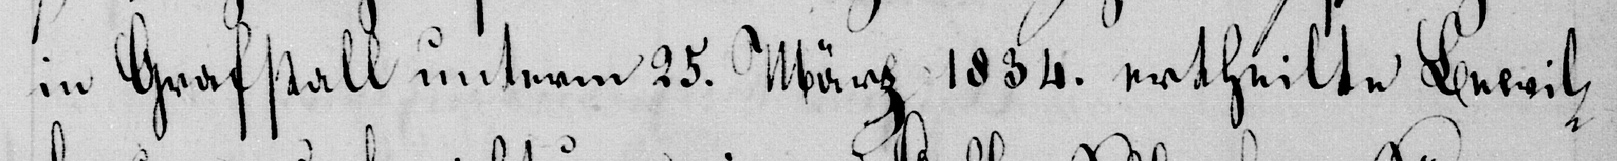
in Grafstall unterm 25. März 1834. ertheilte Bewil¬
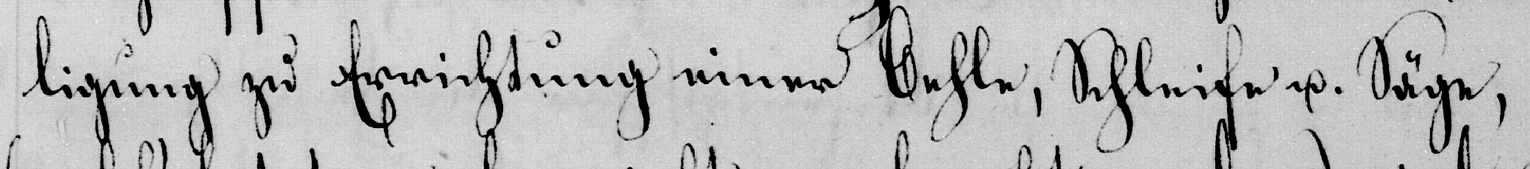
ligung zu Errichtung einer Oehle, Schleife u. Säge,
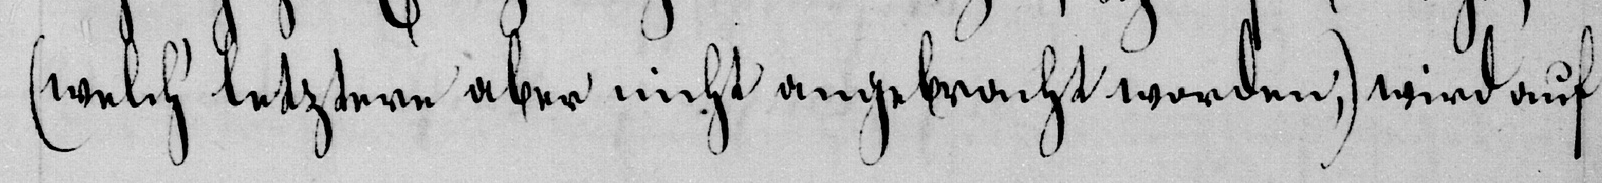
(welch’ letztere aber nicht angebracht worden;) wird auf
